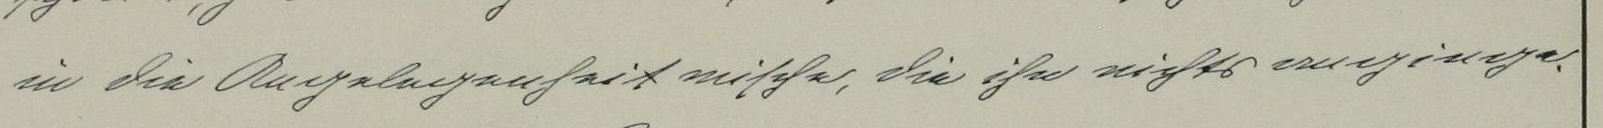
in die Angelegenheit mische, die ihn nichts anginge.
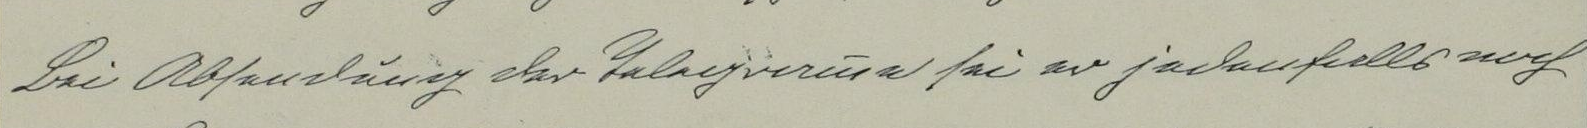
Bei Absendung der Telegramme sei er jedenfalls noch
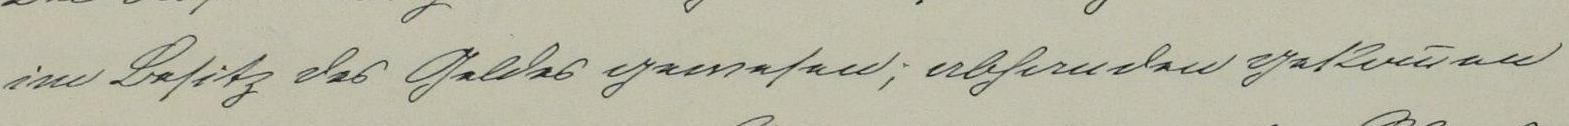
im Besitz des Geldes gewesen; abhanden gekommen
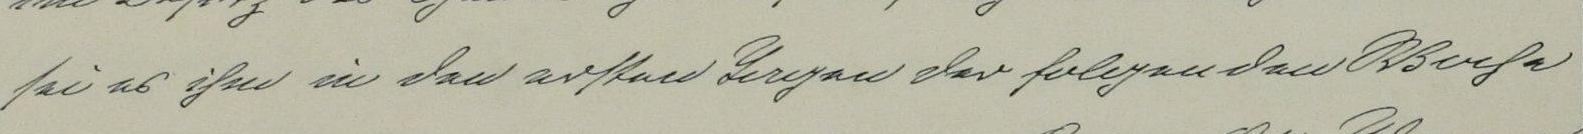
sei es ihm in den ersten Tagen der folgenden Woche
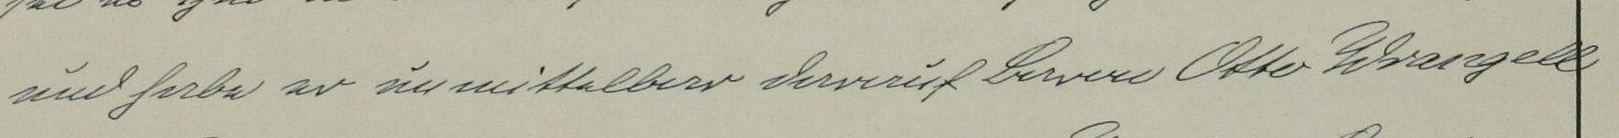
und habe er unmittelbar darauf Baron Otto Wrangell
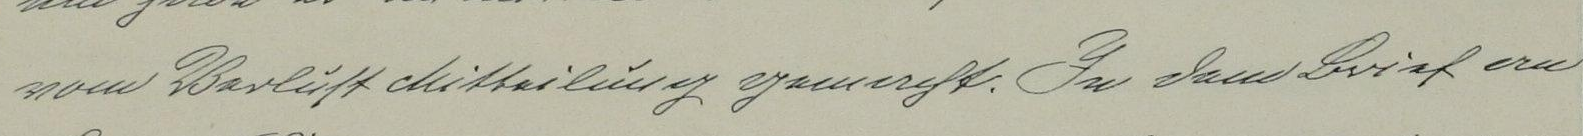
vom Verlust Mitteilung gemacht. In dem Brief an
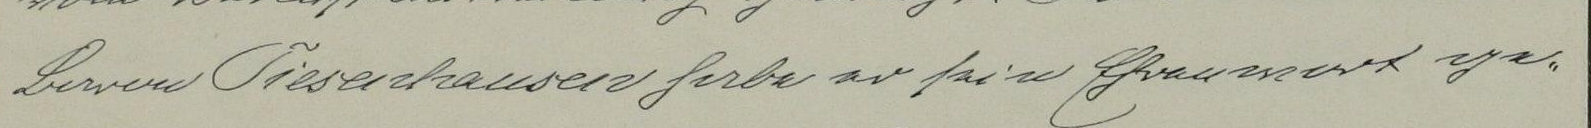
Baron Tiesenhausen habe er sein Ehrenwort ge-
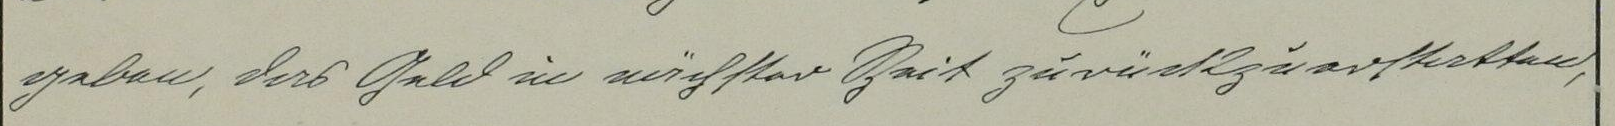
geben, das Geld in nächster Zeit zurückzuerstatten,
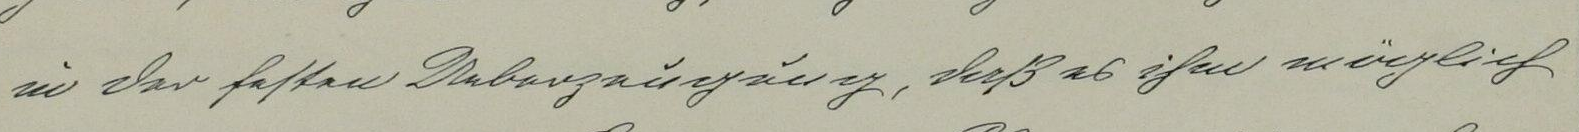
in der festen Ueberzeugung, daß es ihm möglich
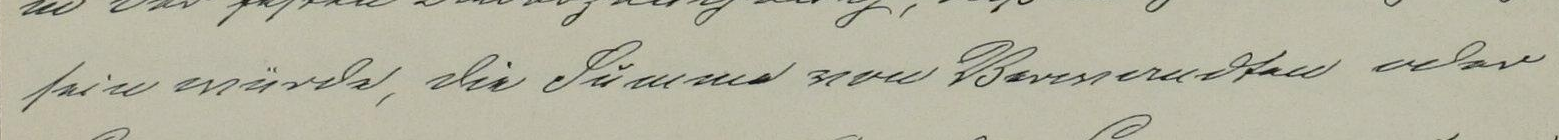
sein würde, die Summe von Verwandten oder
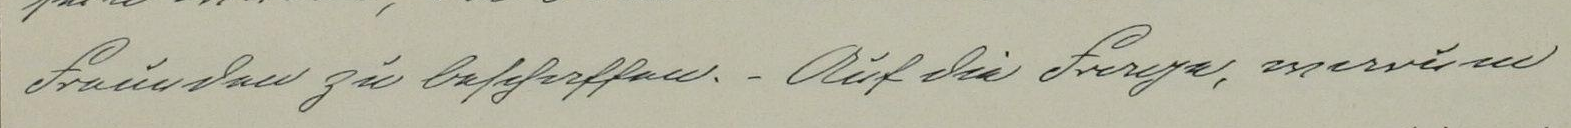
Freunden zu beschaffen. – Auf die Frage, warum
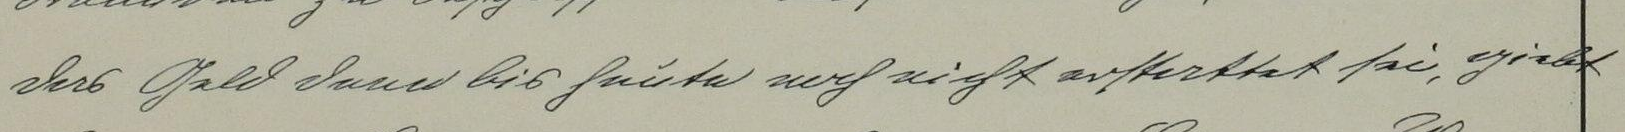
das Geld dann bis heute noch nicht erstattet sei, giebt
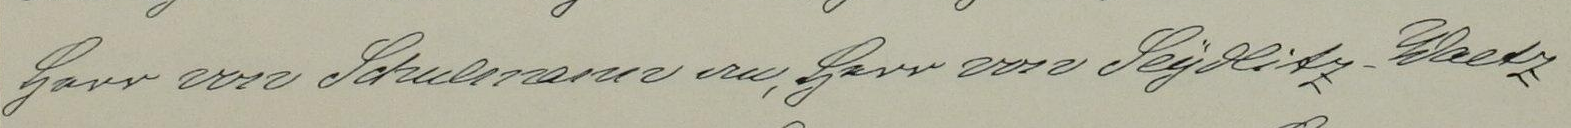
Herr von Schulmann an, Herr von Seydlitz-Waetz
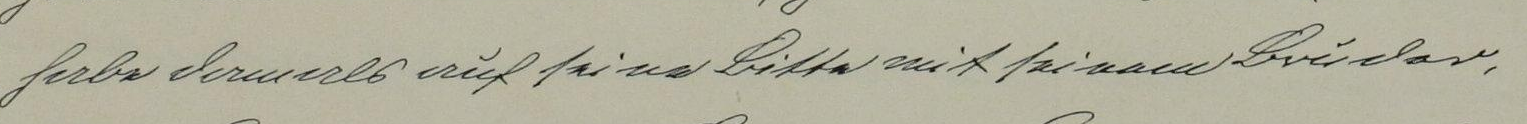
habe damals auf seine Bitte mit seinem Bruder,
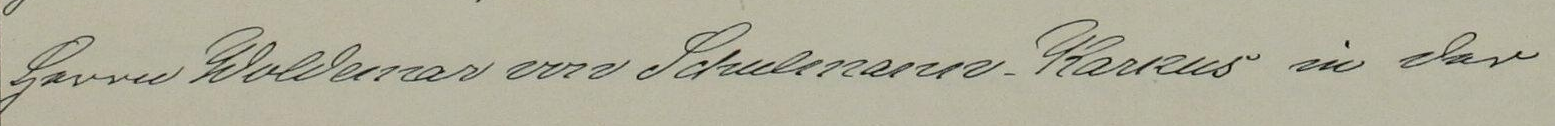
Herrn Woldemar von Schulmann-Karkus in der
